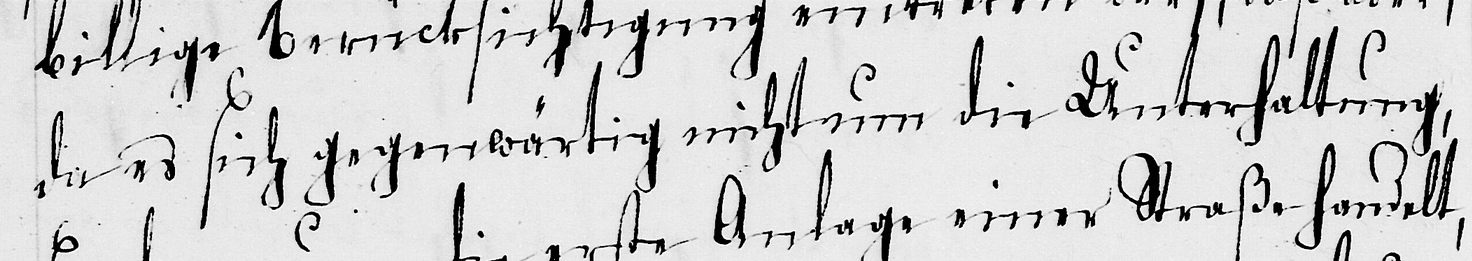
da es sich gegenwärtig nicht um die Unterhaltung,
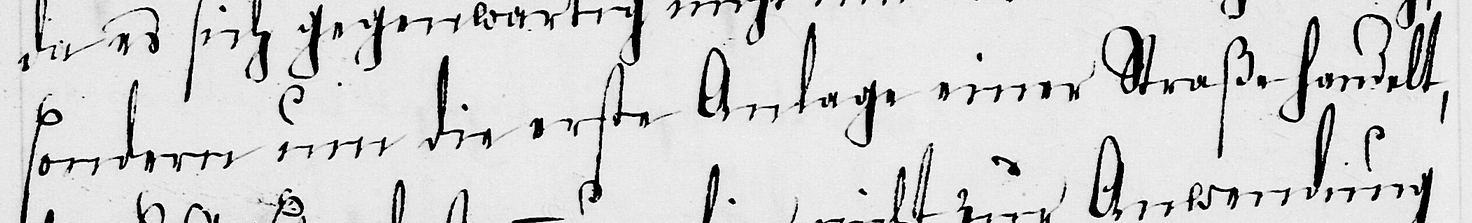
sondern um die erste Anlage einer Straße handelt,
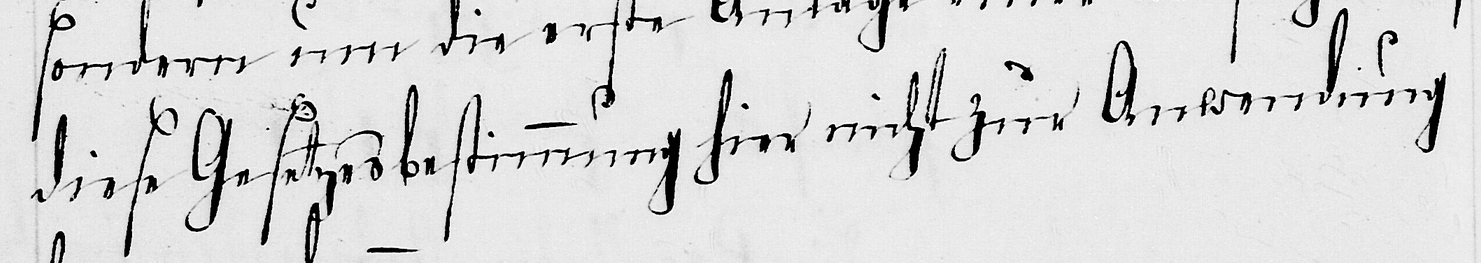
diese Gesetzesbestimmung hier nicht zur Anwendung
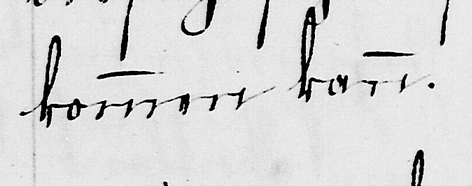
kommen kann.
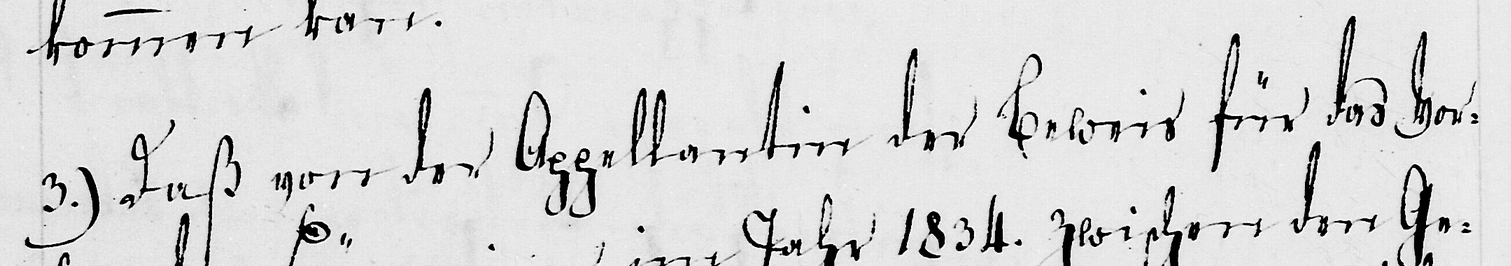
3.) Daß von der Appellantin der Beweis für das Vor¬
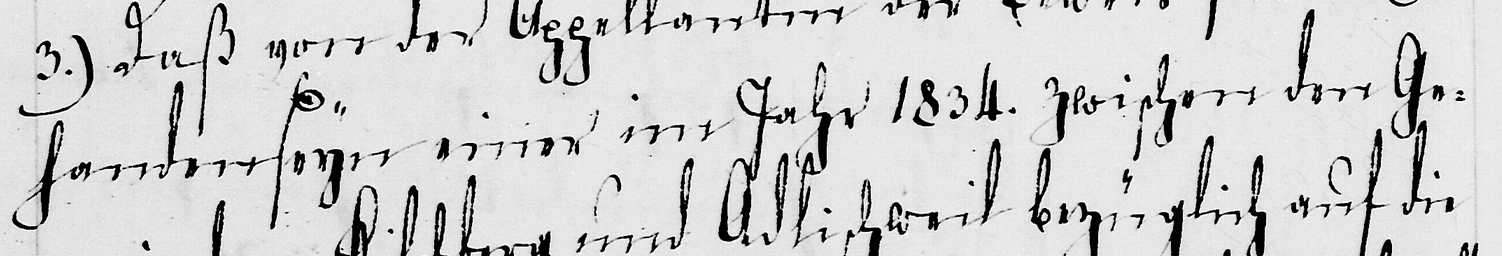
handenseyn einer im Jahr 1834. zwischen den Ge¬
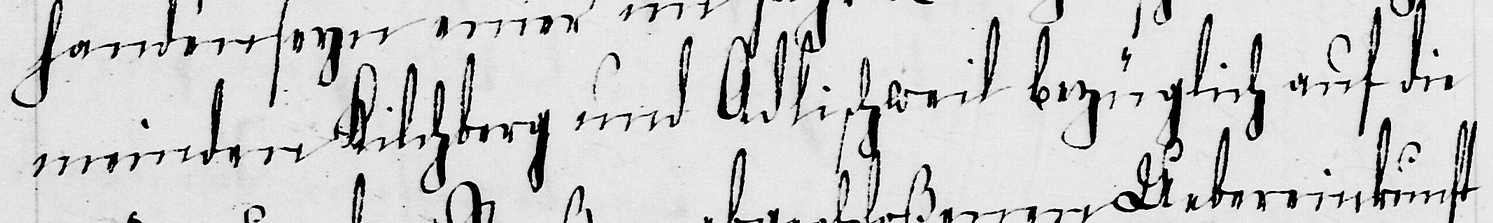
meinden Kilchberg und Adlischweil bezüglich auf die
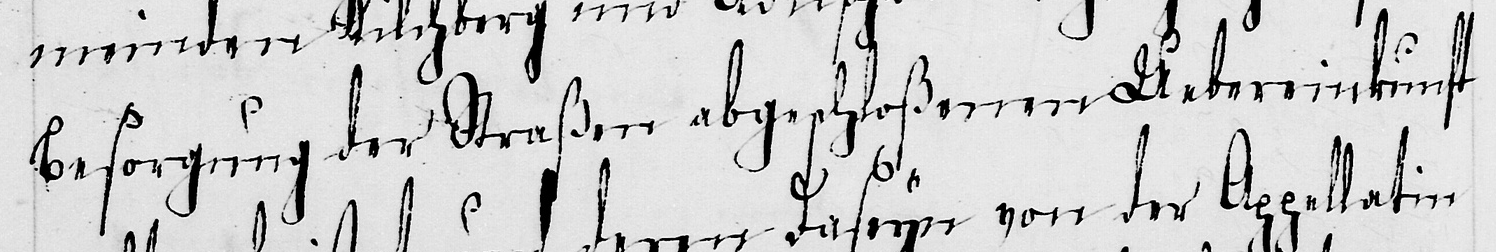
Besorgung der Straßen abgeschloßenen Uebereinkunft
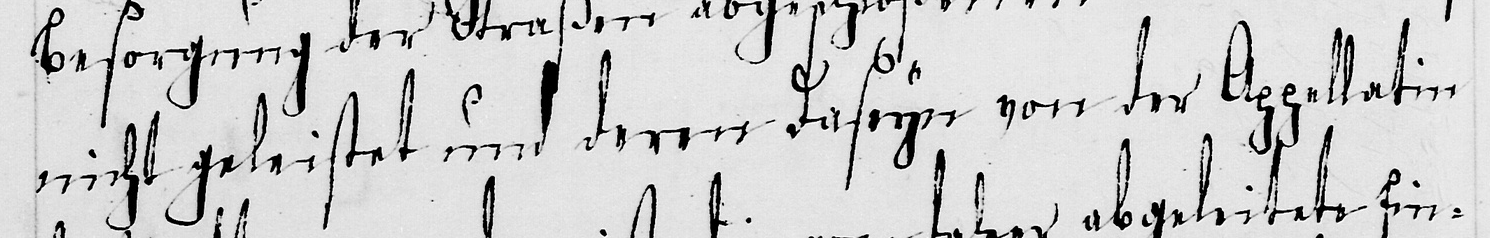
nicht geleistet und deren Daseyn von der Appellatin
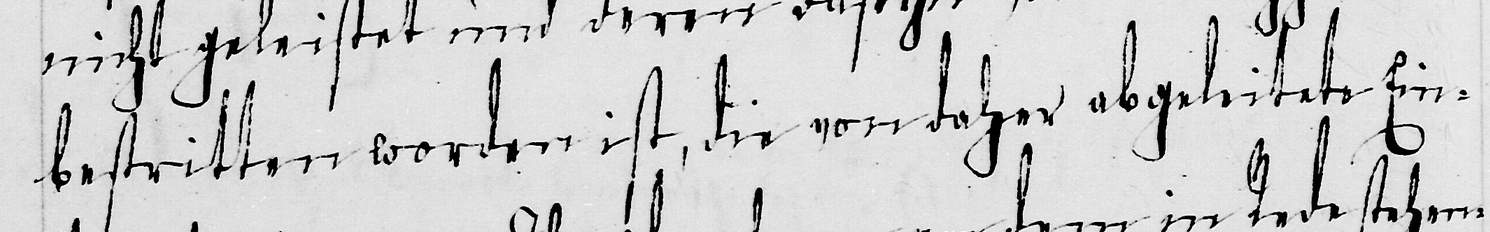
bestritten worden ist, die von daher abgeleitete Ein¬
